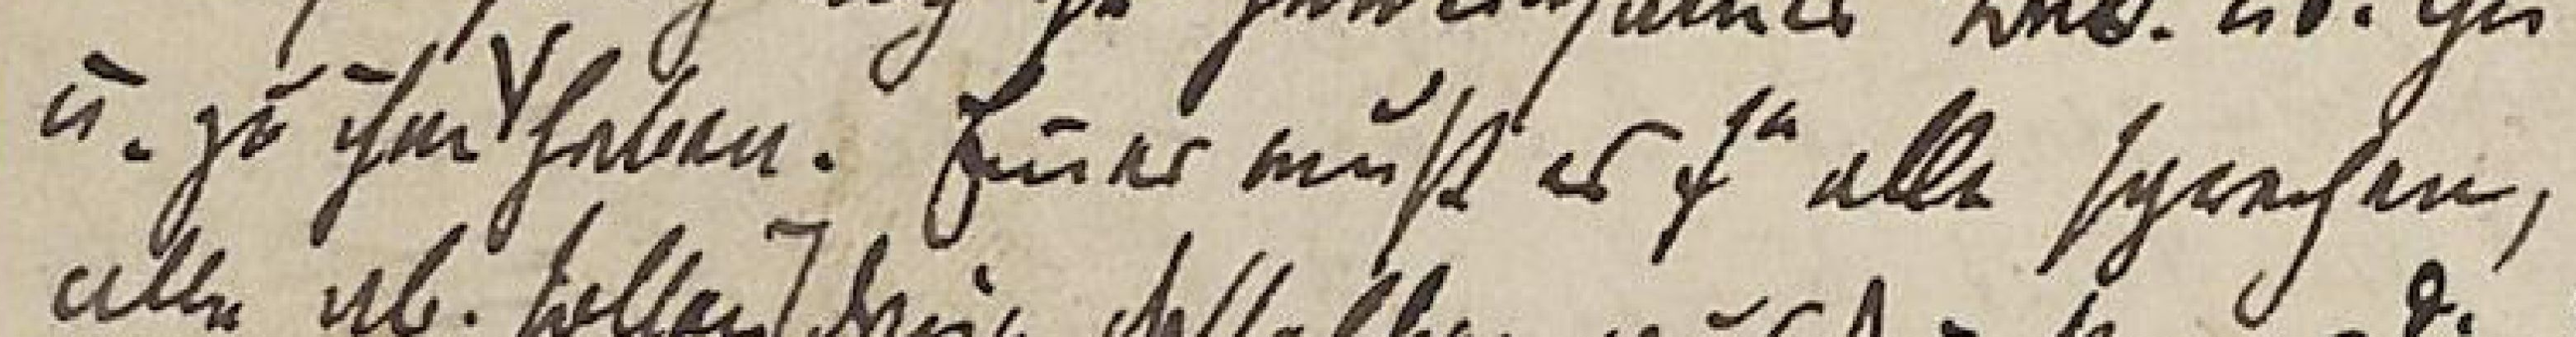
u. zu ihm haben. Einer muß es fü alle sprechen,
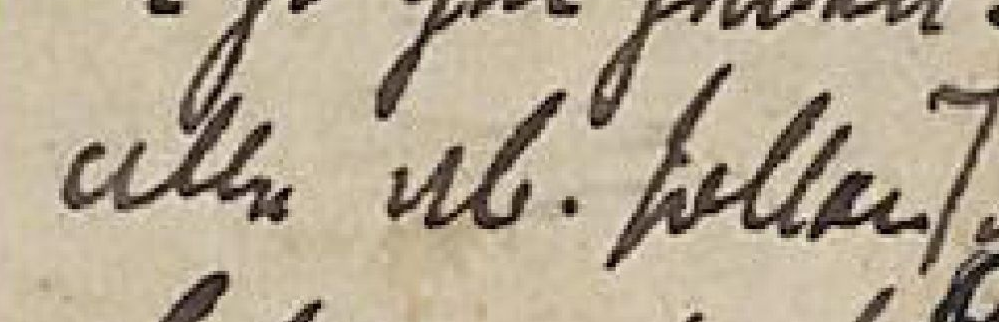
alle ab. sollen ]
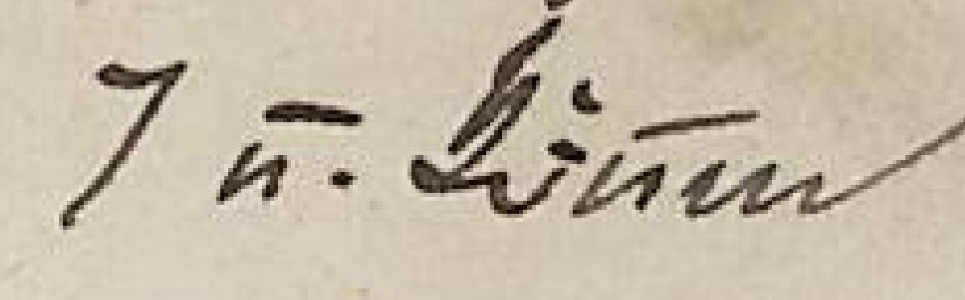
u. könen
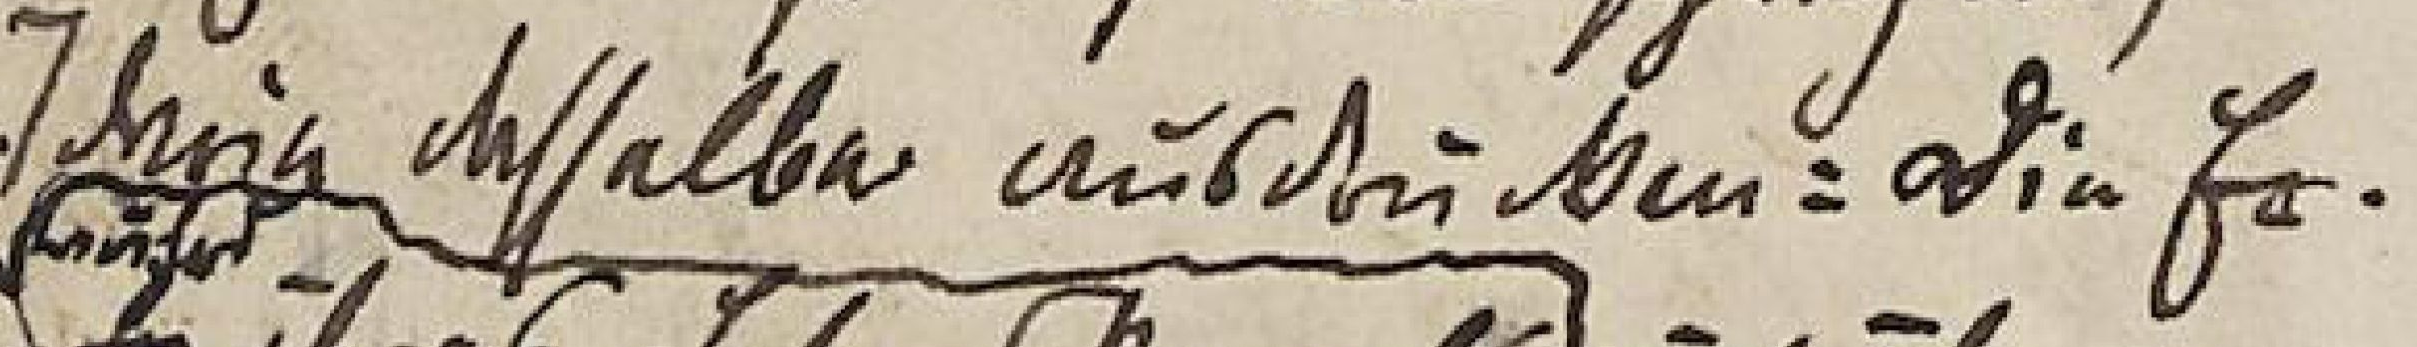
darin dasselbe ausdrücken: Die Er¬
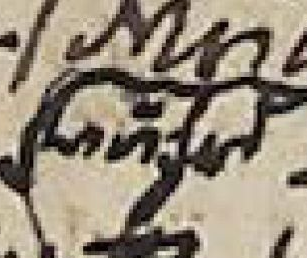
währd
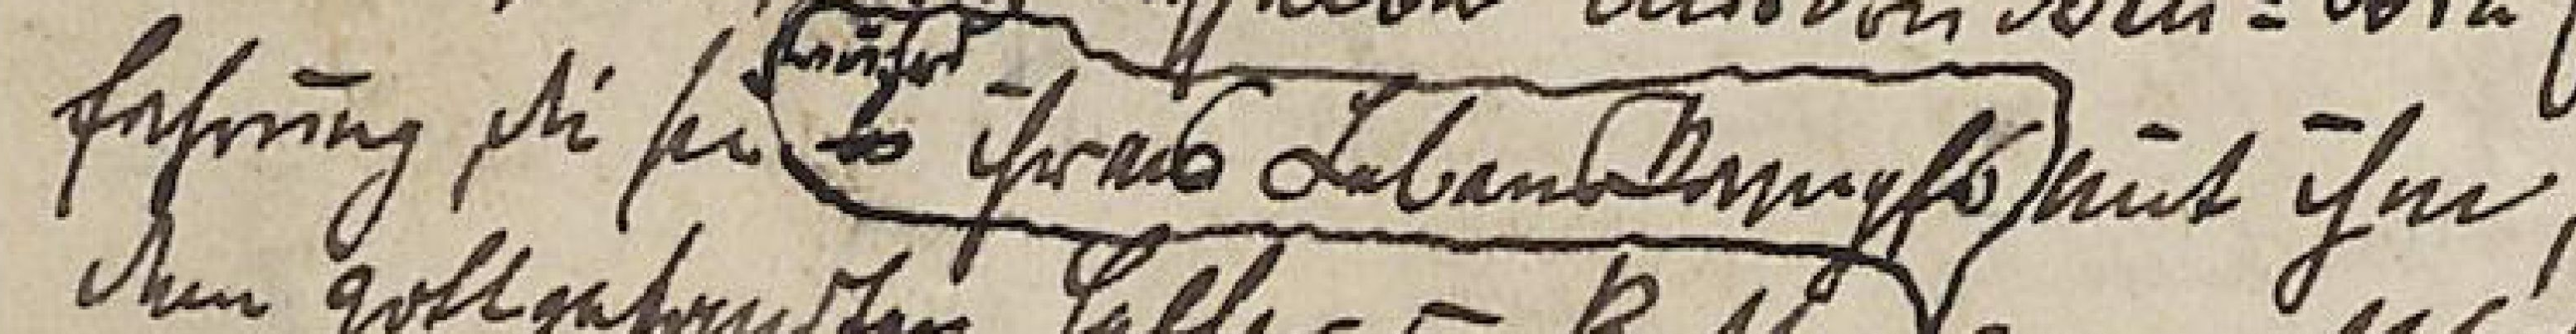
fahrung, die sie d ihres Lebenskampfs mit ihm,
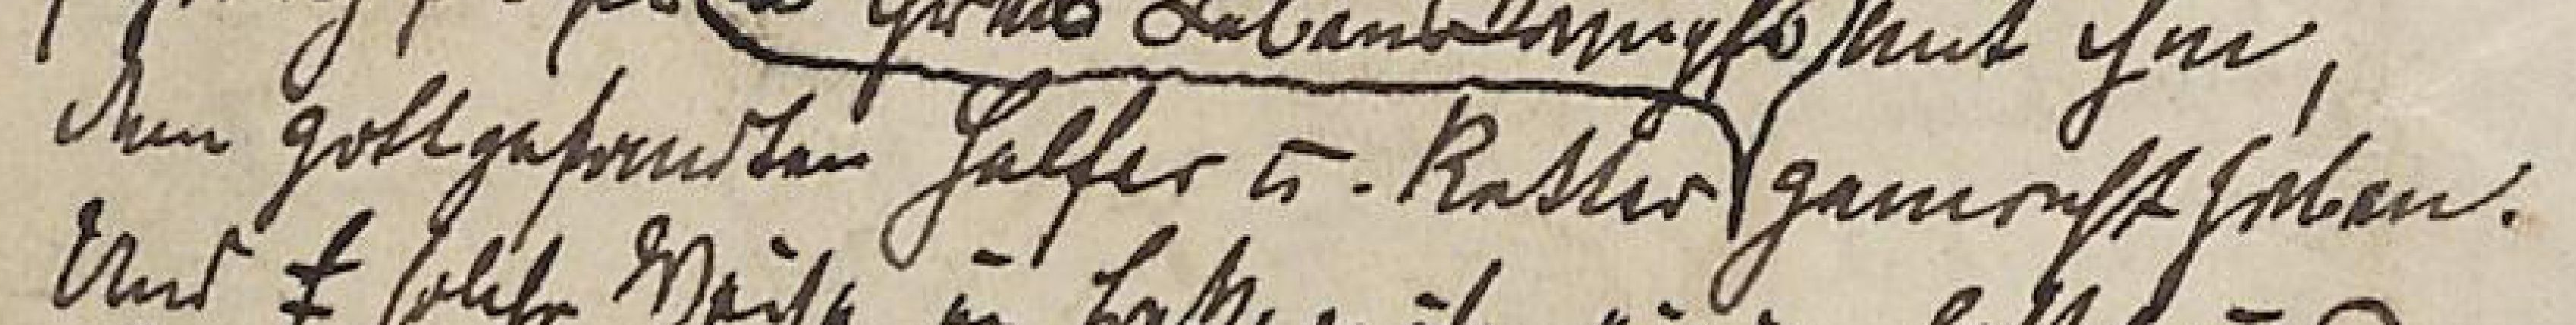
dem gottgesandten Helfer u. Retter gemacht haben.
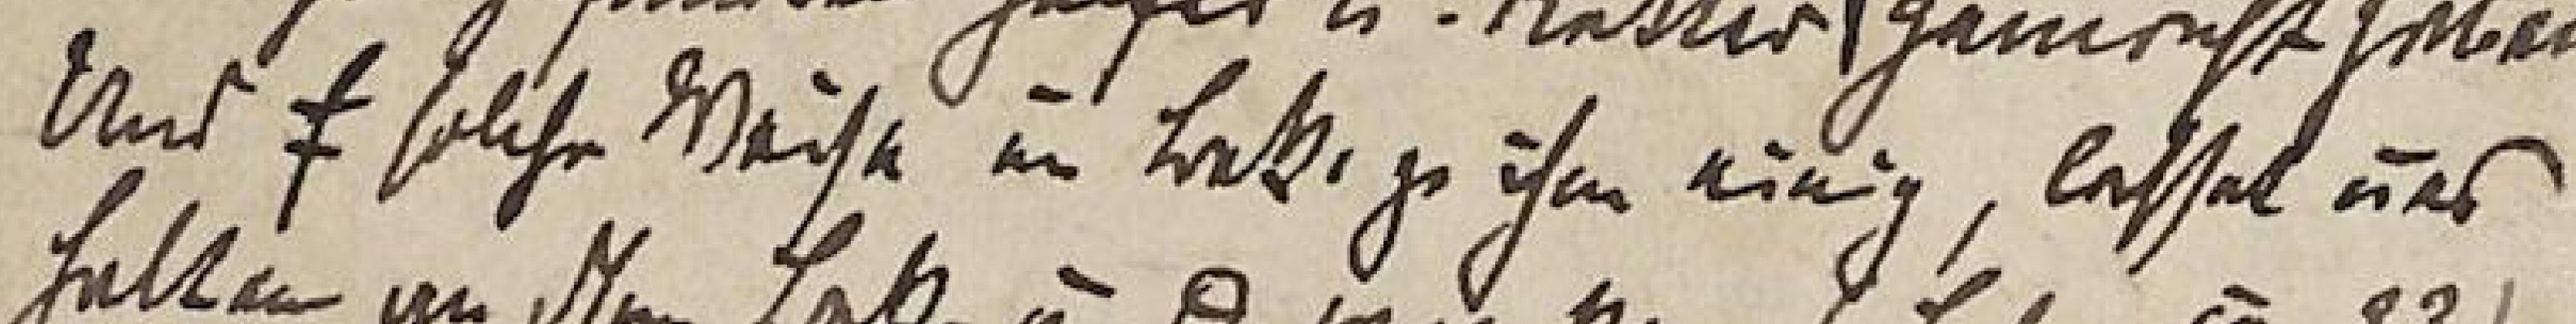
Und f. solche Weise im Bek. z. ihm einig, lasst uns
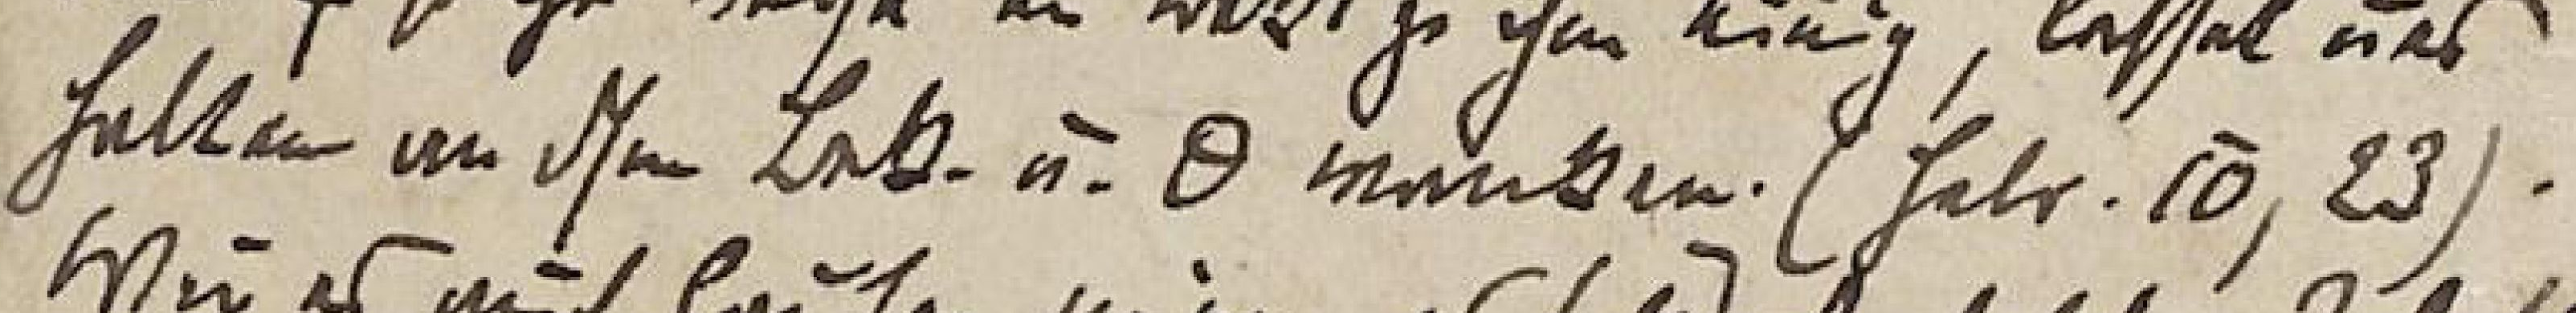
halten an dsm Bek. u. o wanken (Hebr. 10,23).
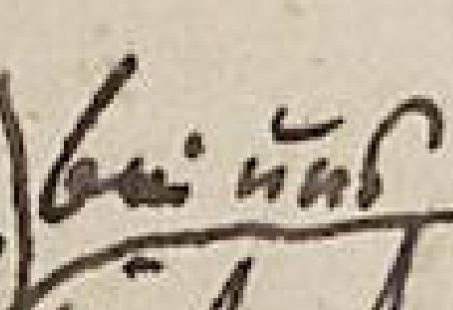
bei uns
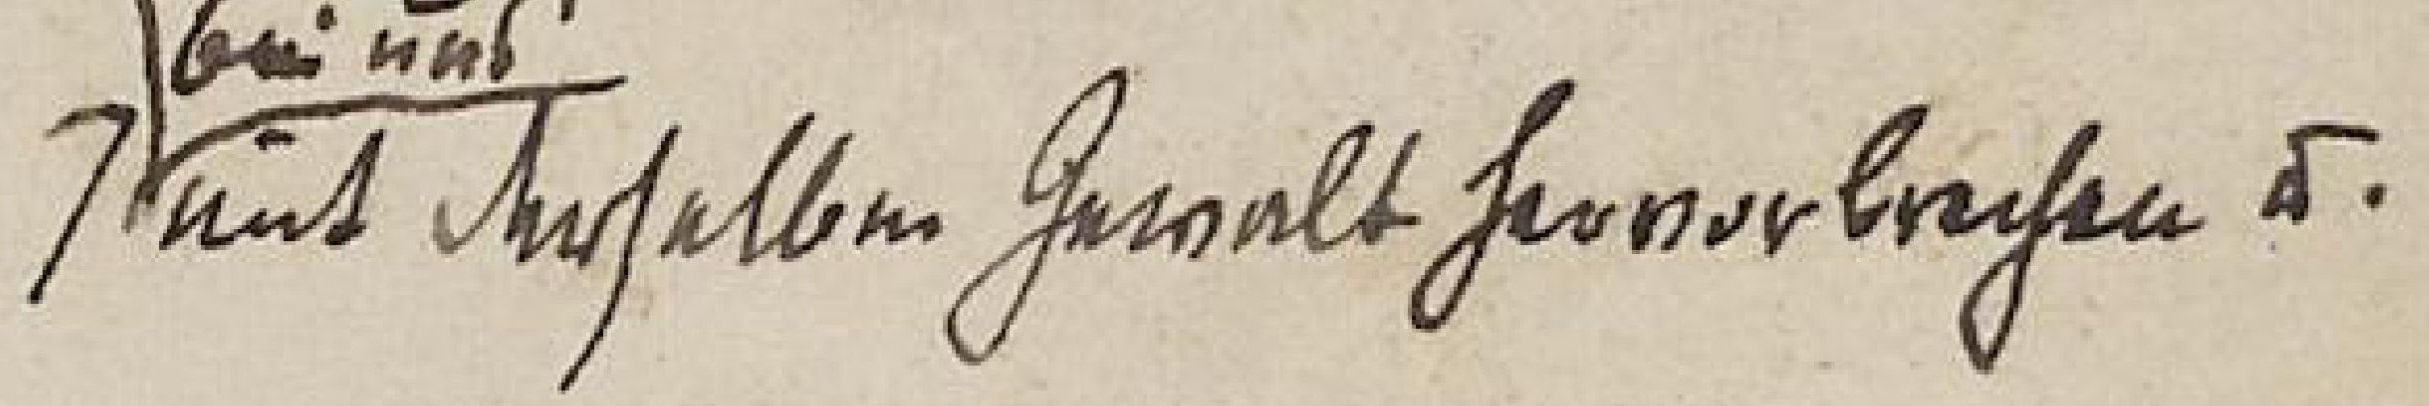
mit derselben Gewalt hervorbrechen u.
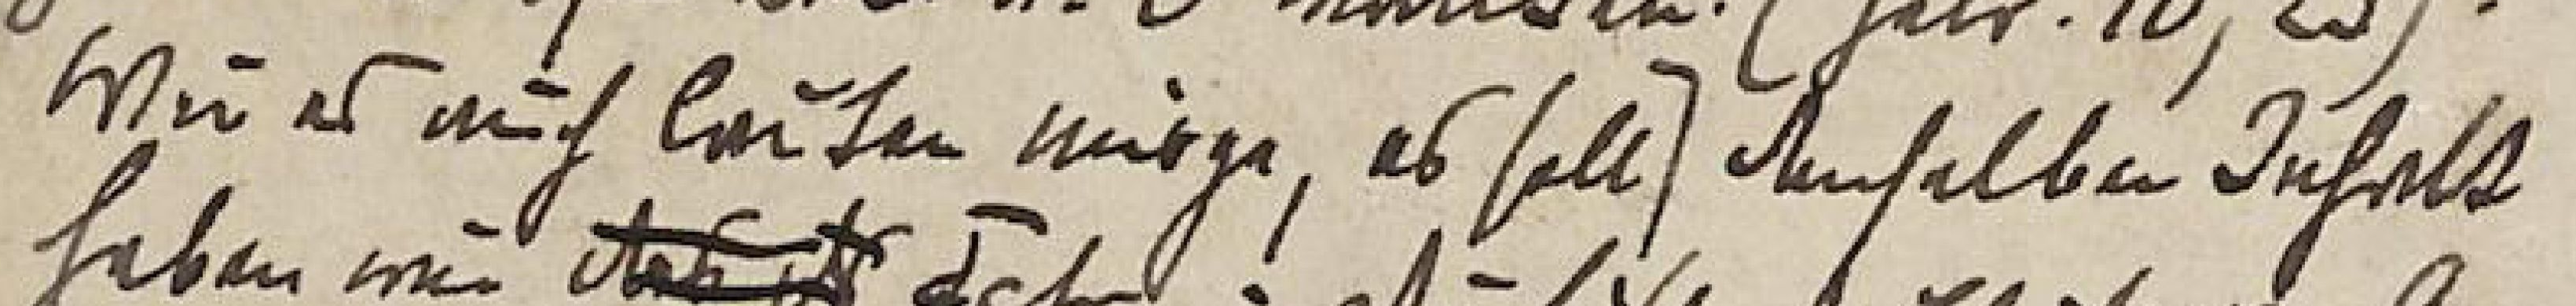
Wie es auch lauten möge, es soll ] denselben Inhalt
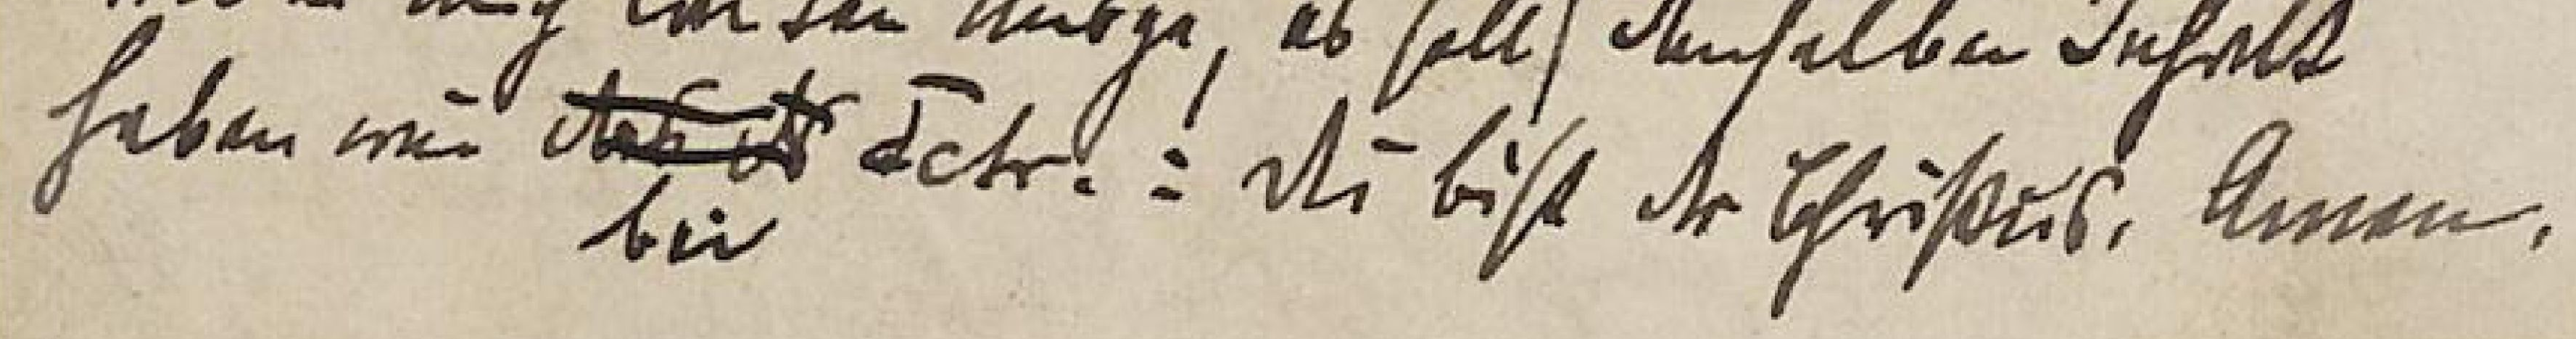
haben wie das ds Petr.: Du bist der Christus. Amen.
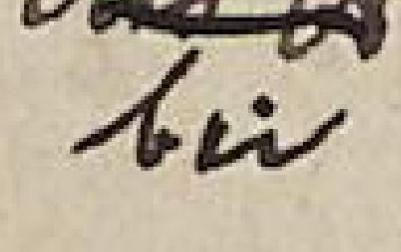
bei
